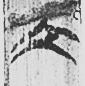文
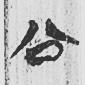公
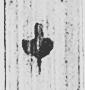十
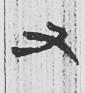又
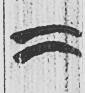二
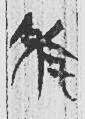年
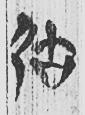居
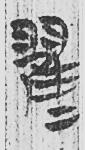翟
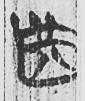甚
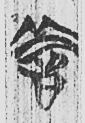善
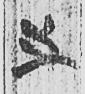之
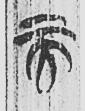而
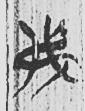弗
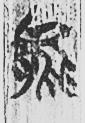能
